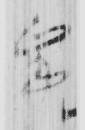允
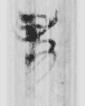男
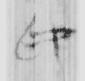女
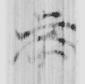不
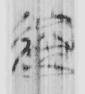{止達}
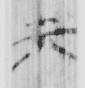亓
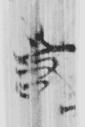𠱾
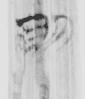則
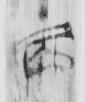民
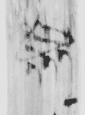眾
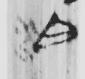泊
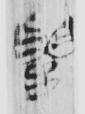{門串}
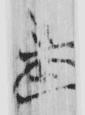市
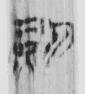則
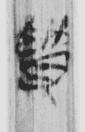{貝爲}
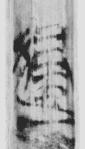{辶帚}
